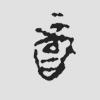音
